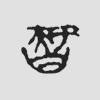智
